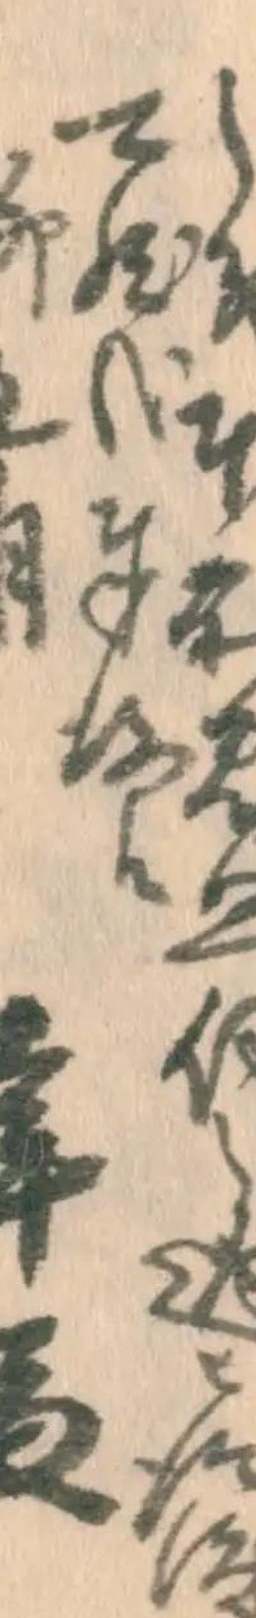可然哉奉存候
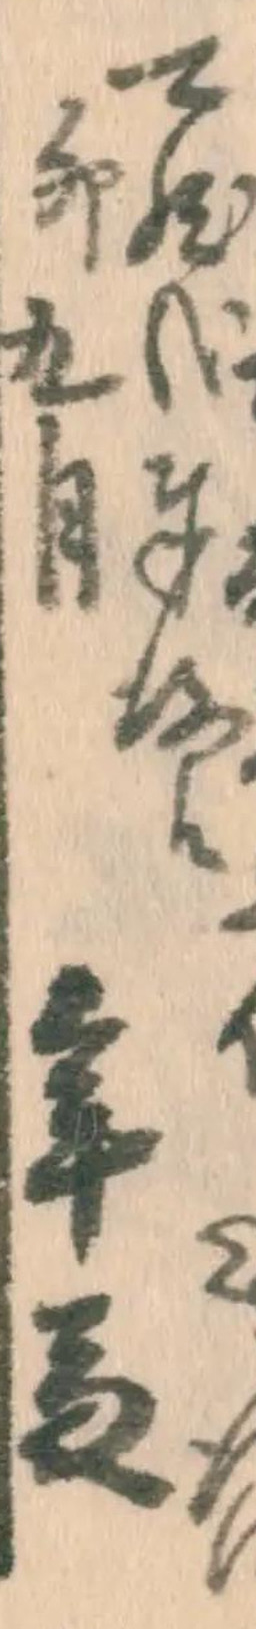卯九月年番
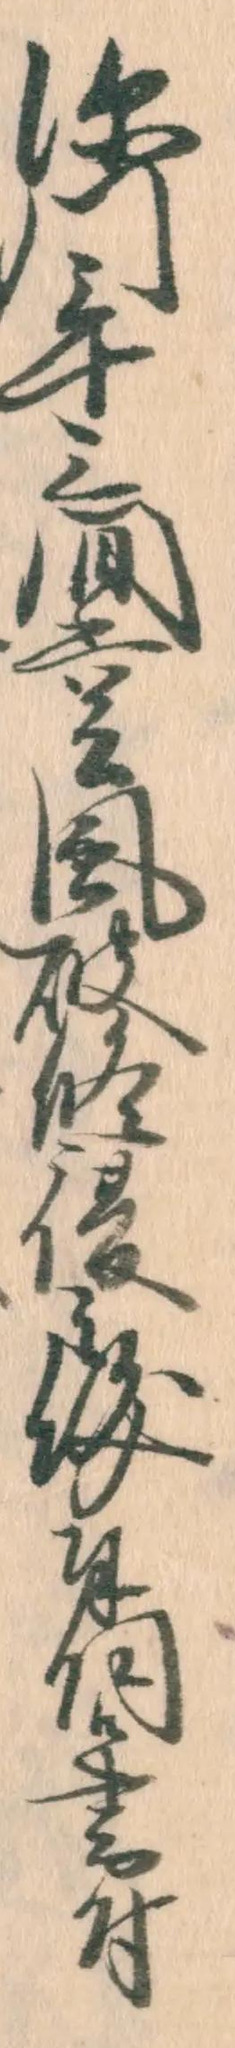深川三十三間堂風破修復之儀奉伺候書付
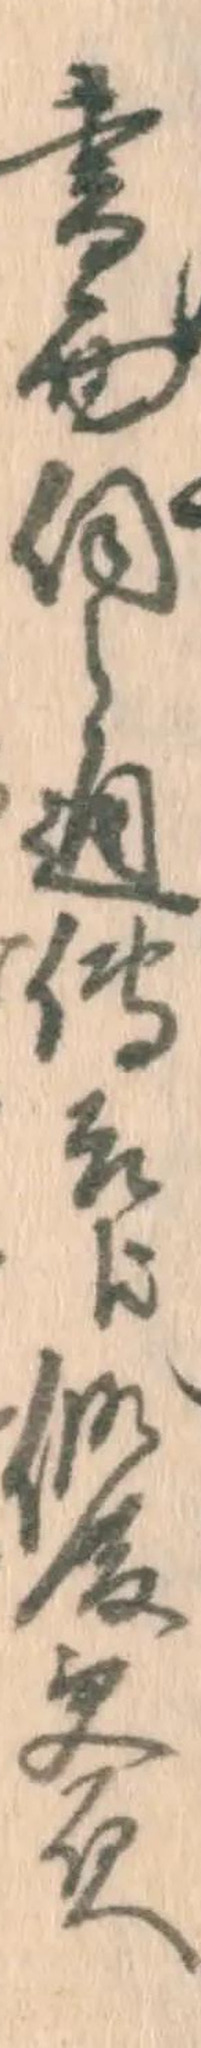書面伺之通伝吉え修復受負
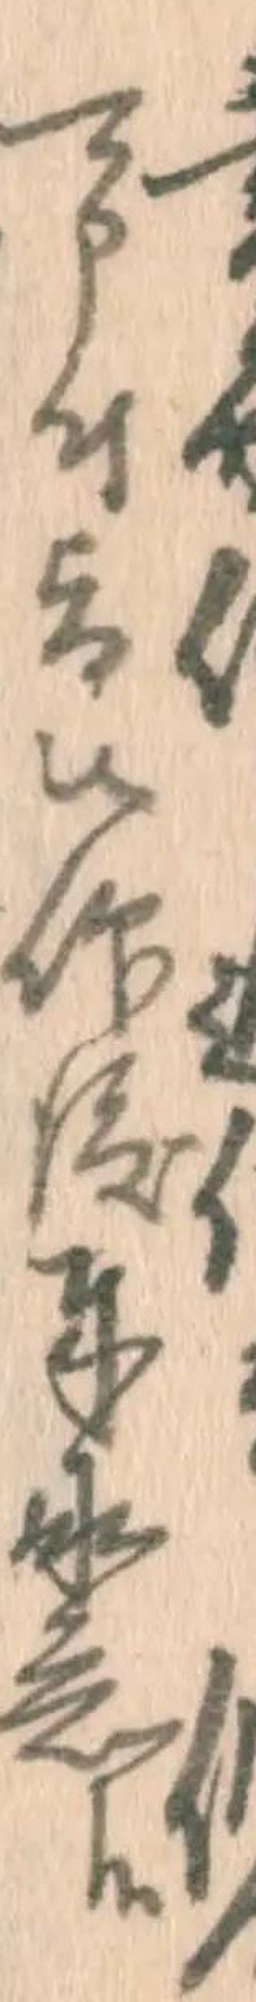可申付旨被仰渡奉承知候
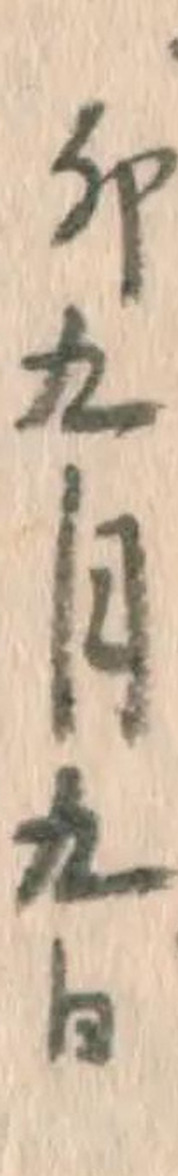卯九月年番
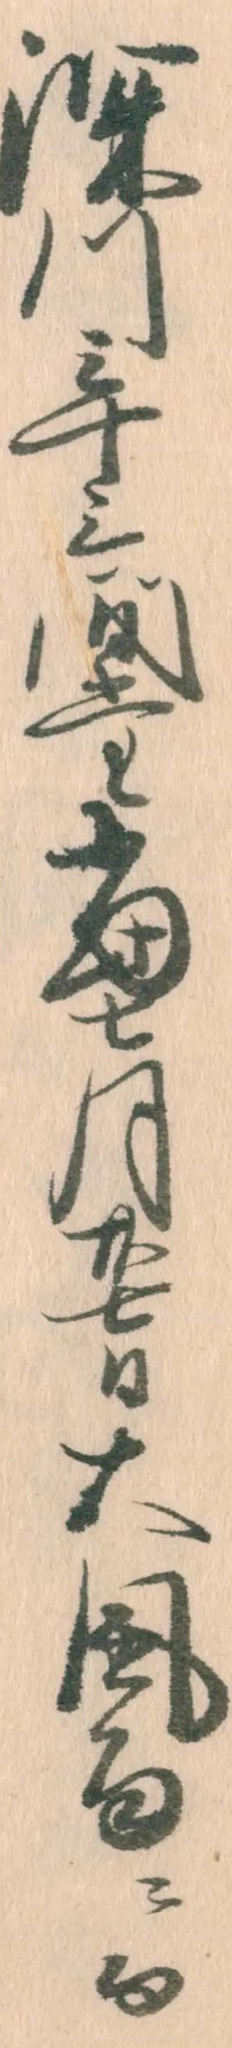深川三十三間堂当七月廿七日大風雨に而
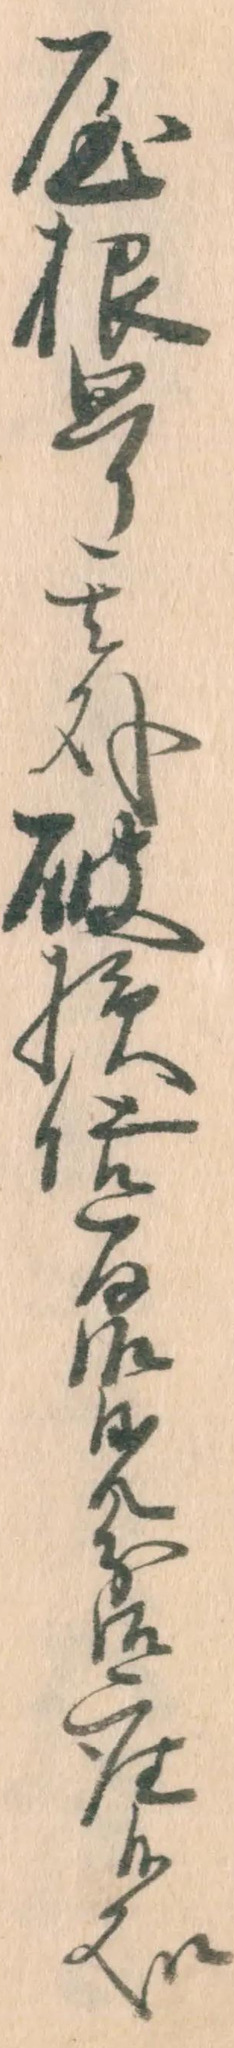屋根廻り其外破損仕候間御見分御座候処

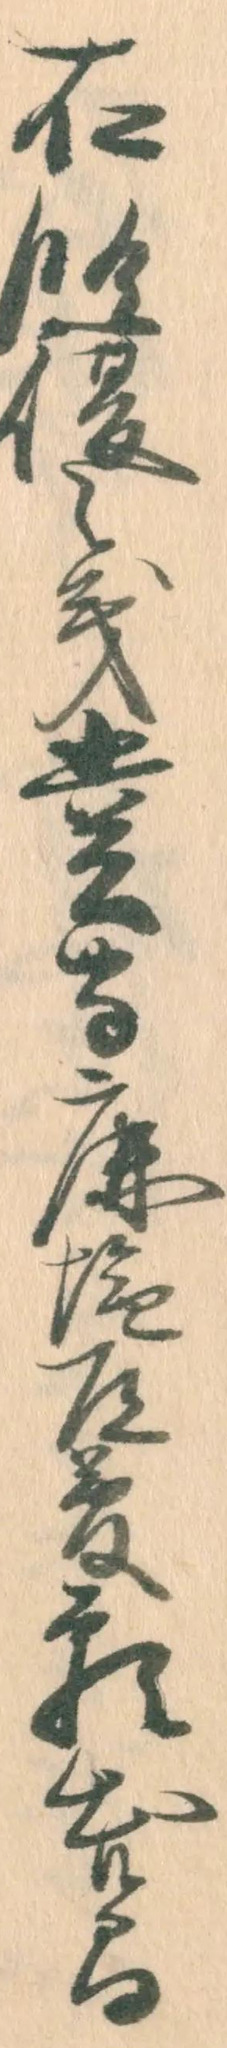右修復之義堂守鹿塩道菅願出候間
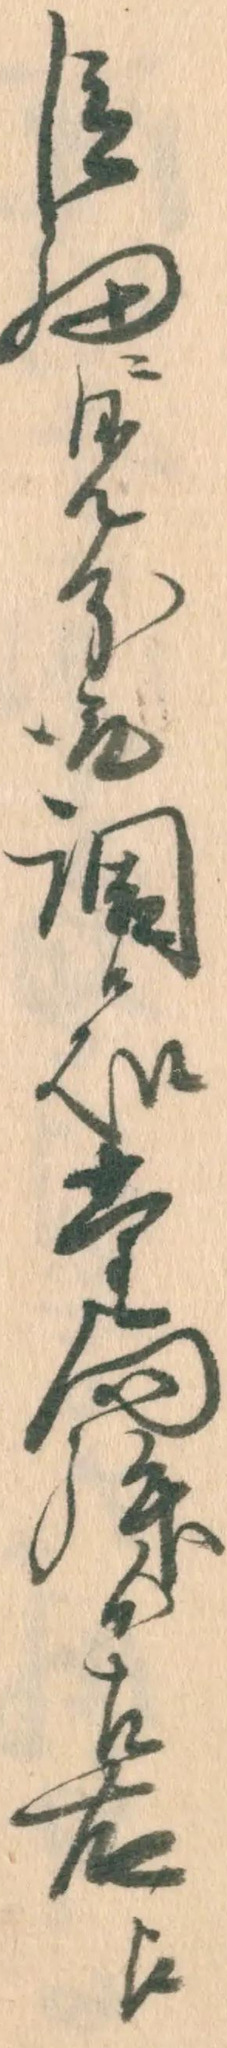巨細に見分取調候処堂向拝ゟ右左え
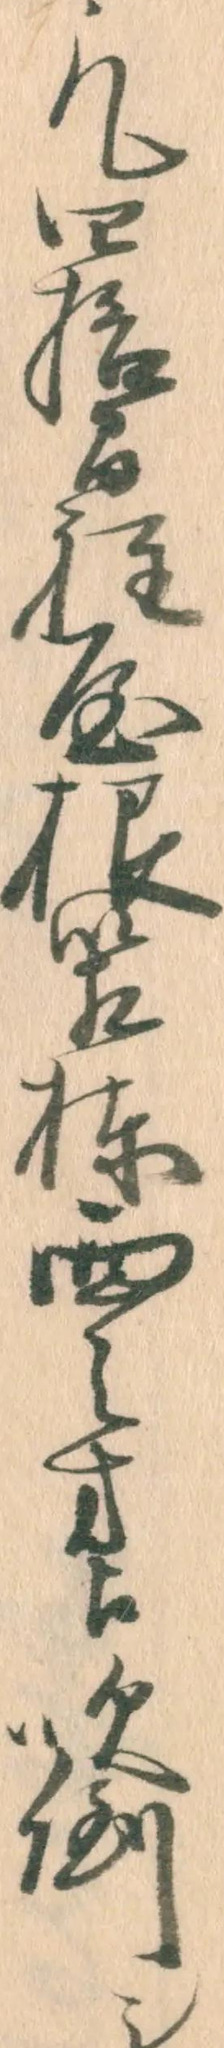凡四拾間程屋根箱棟西之方え吹倒れ
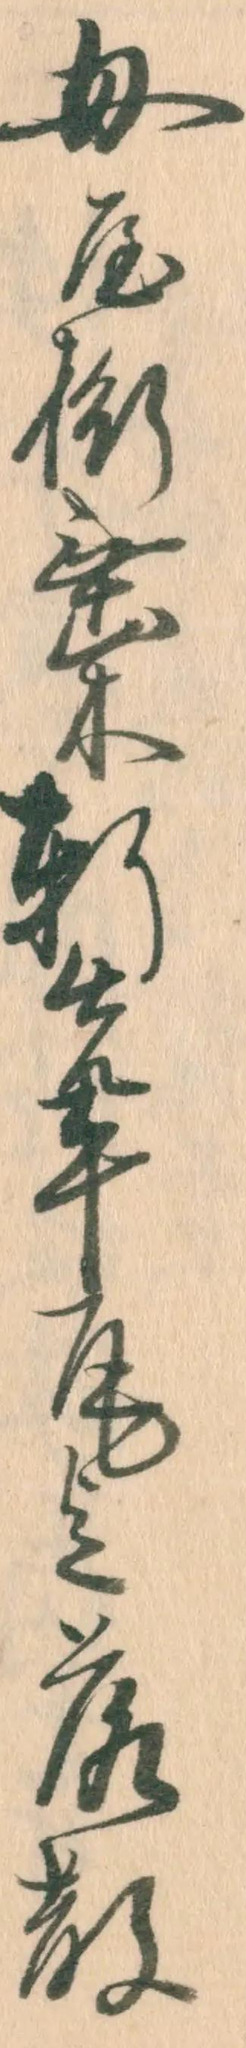母屋桁垂木軒先平瓦迄落散
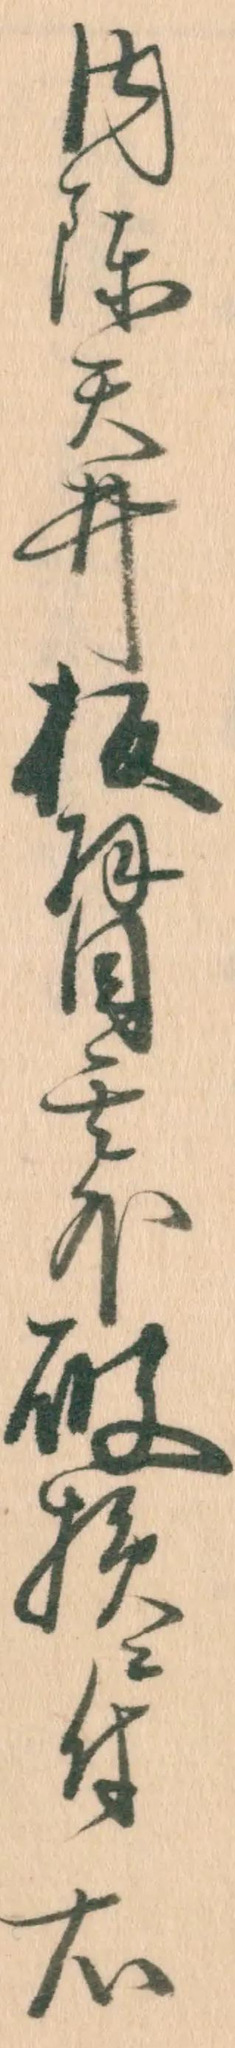内陣天井板羽目其外破損に付右
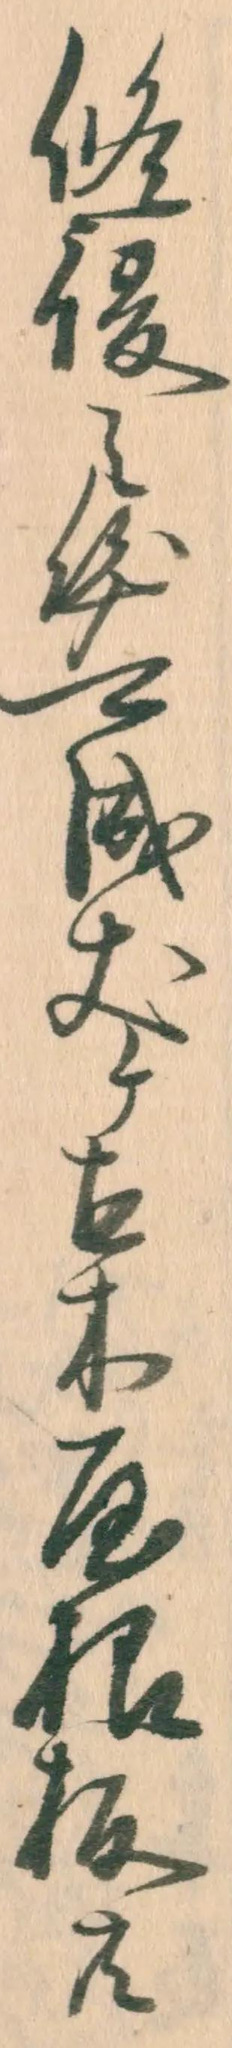修復之儀可成丈ヶ古木屋根板共
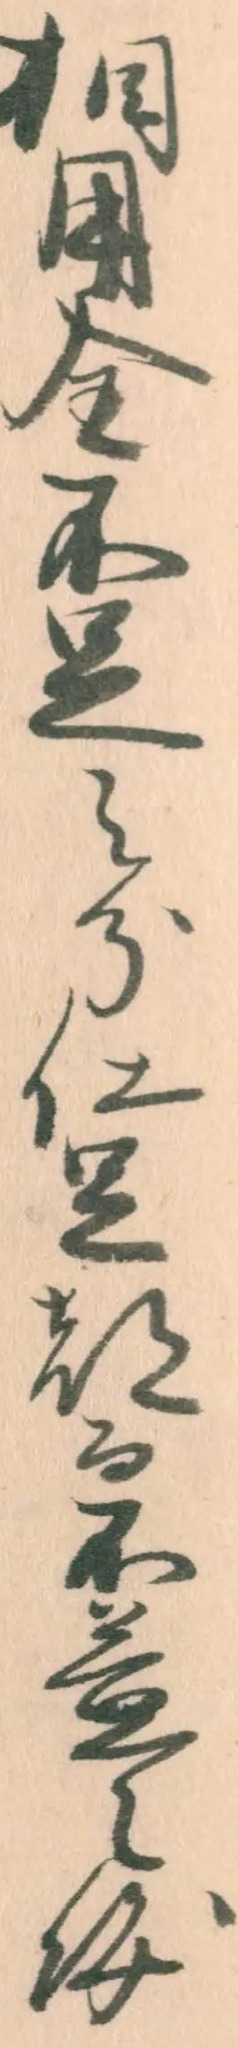相用全不足之分仕足都而不益之儀
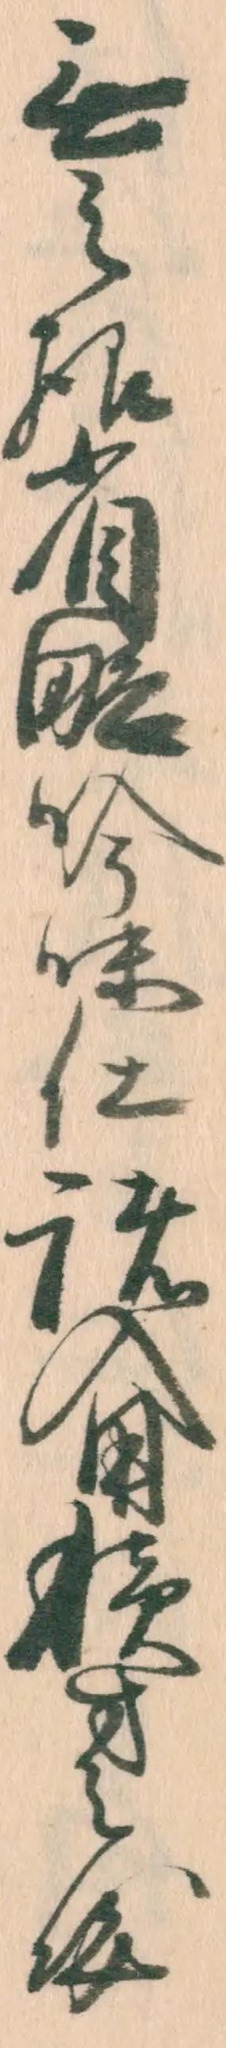無之様省略吟味仕諸入用積方之儀
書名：三十三間堂. [1]
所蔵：国立国会図書館 National Diet Library, JAPAN
